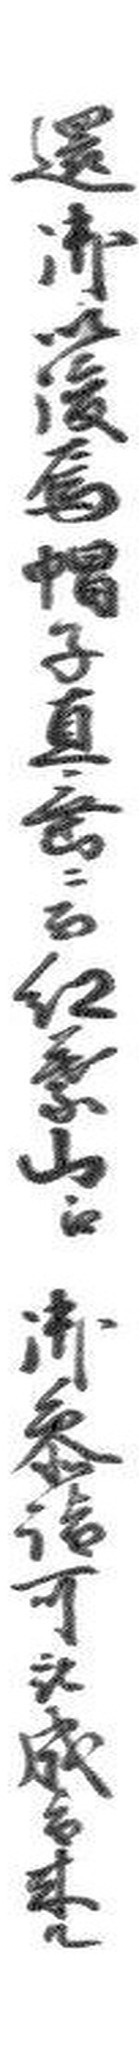還御以後烏帽子直垂ニ而紅葉山江御参詣可被成旨来ル
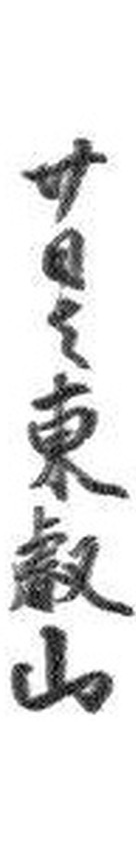廿日者東叡山
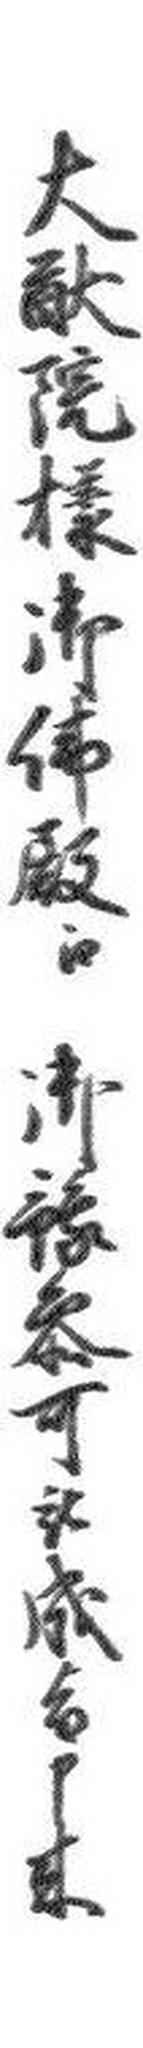大猷院様御仏殿江御豫参可被成旨申来

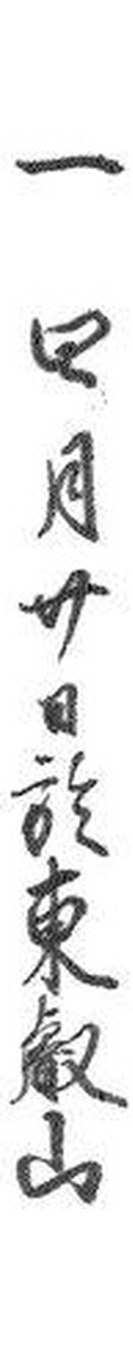一四月廿日於東叡山
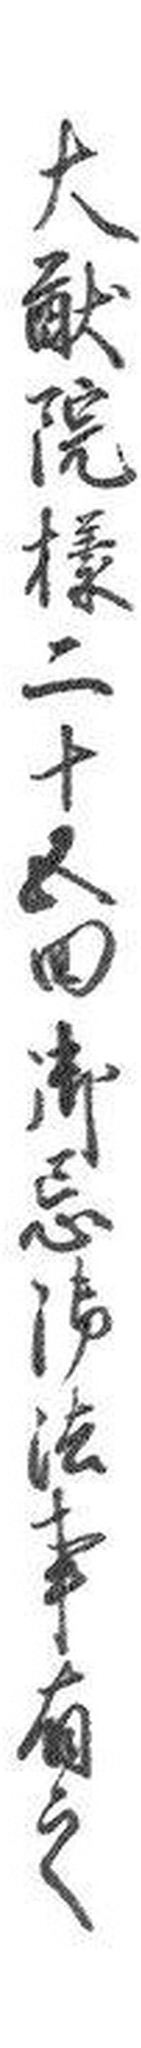大猷院様二十五回御忌御法事有之
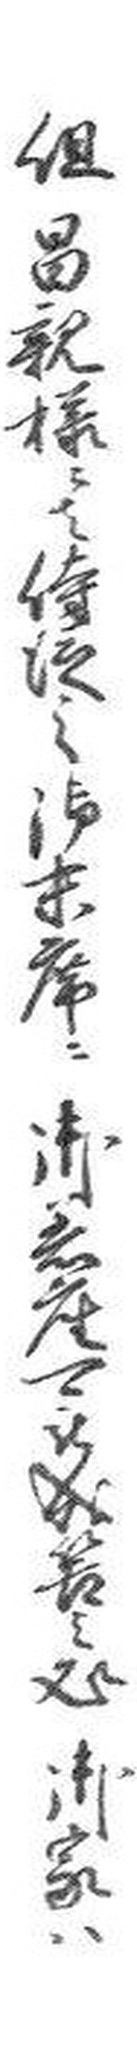但昌親様ニ者侍従之御末席ニ御着座被成筈之処御家ㇵ
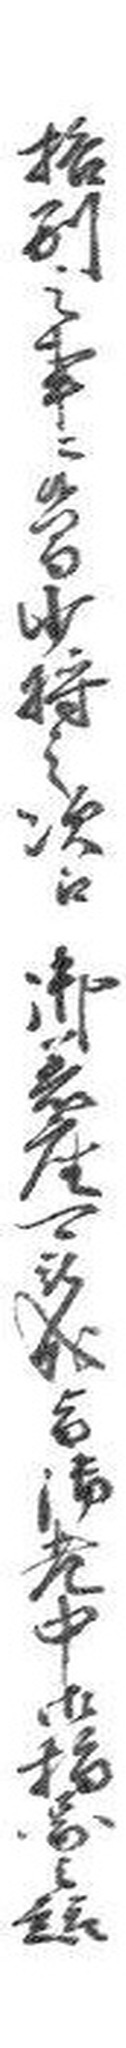格別之事ニ候間少将之次江御着座可被成旨御老中御指図之趣
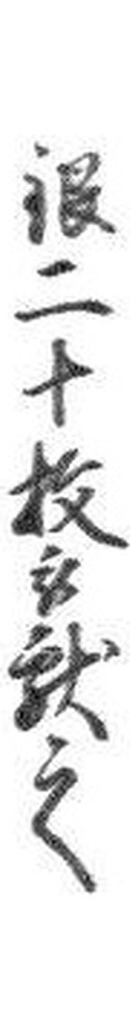銀二十枚被献之
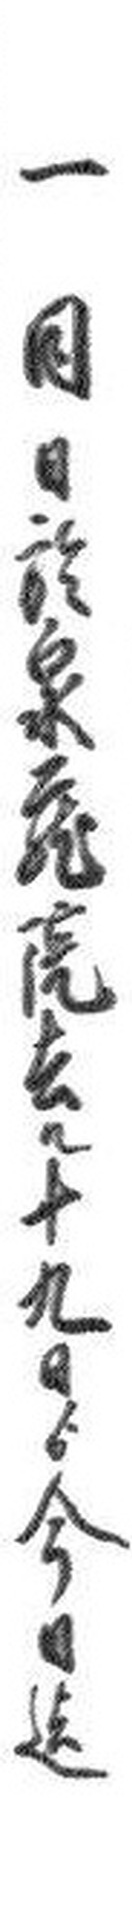一同日於泉蔵院去十九日ゟ今日迄
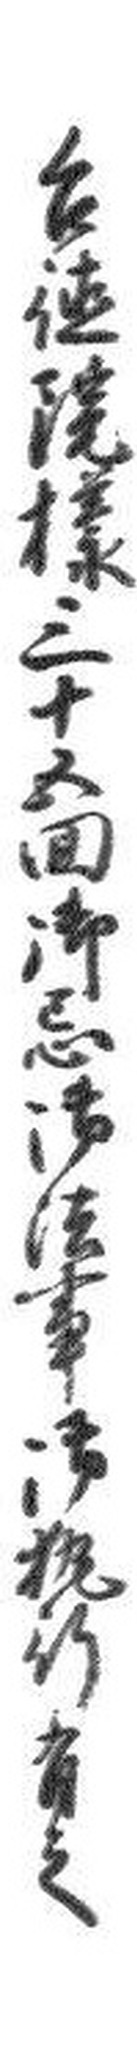台徳院様三十五回御忌御法事御執行有之
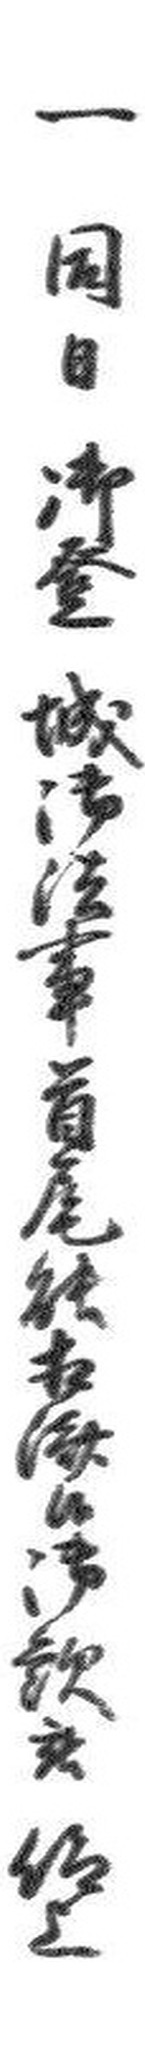一同日御登城御法事首尾能相済候御歓被仰上
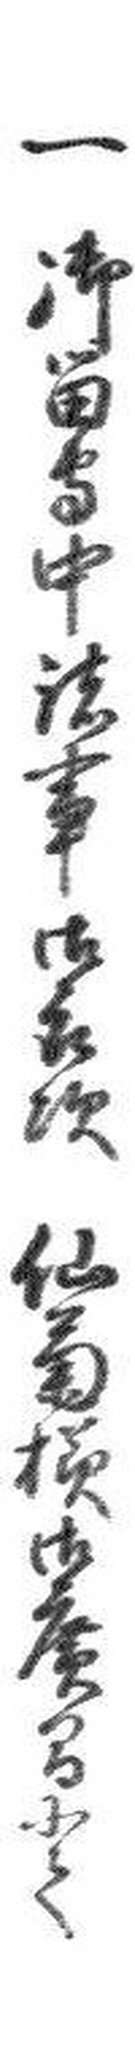一御留守中法事御取次仙菊様御広間にて
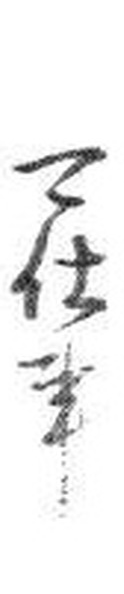可仕事
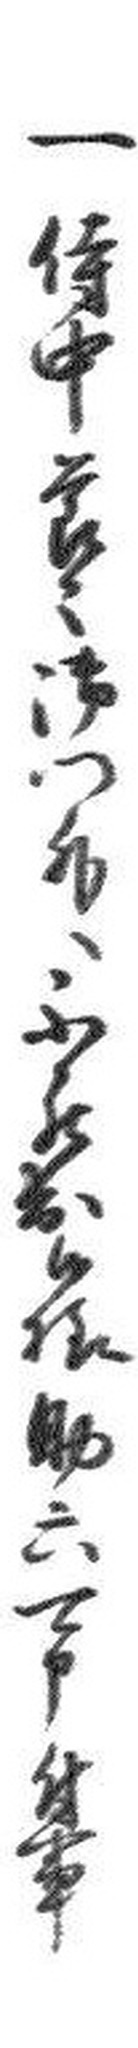一侍中節々御門外ヘ不罷出候様助六可申付事
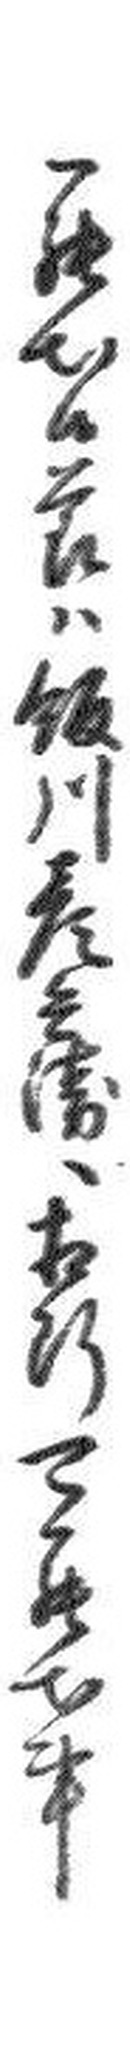罷出候節ㇵ飯川彦兵衛へ相断可罷出事
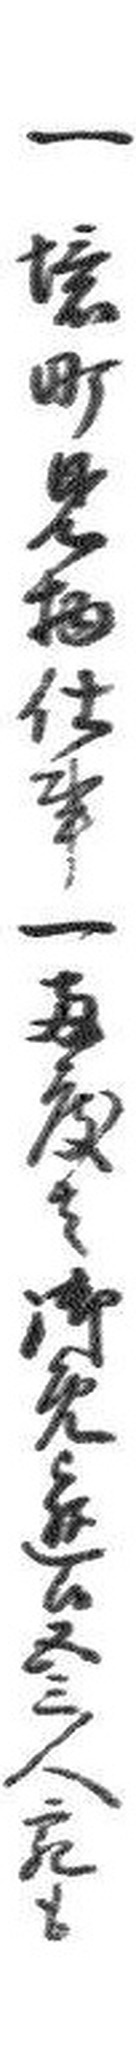一境町見物仕事一両度者御免被遊候五三人宛も
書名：家譜 十一 昌親公 従延宝二年到延宝四年八月
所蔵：福井県文書館 Fukui Prefectural Archives
